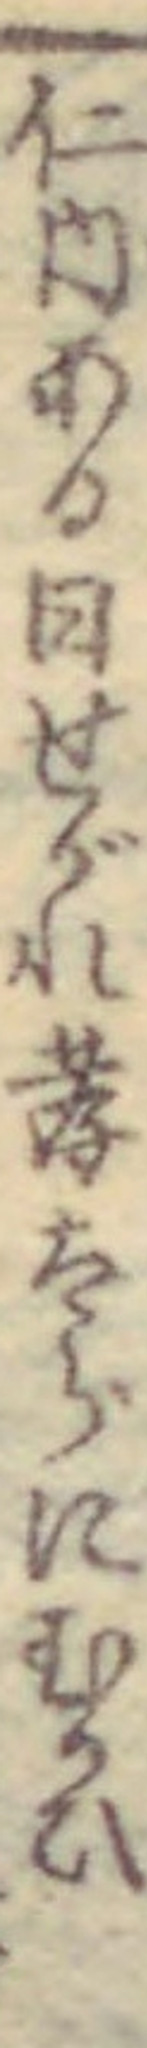仁内ある日せがれ孝太郎にむかひ
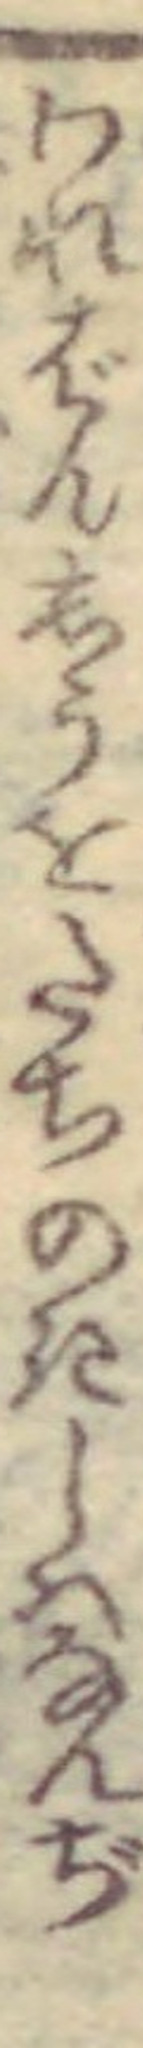わればんしうをたちのきしはなんぢ
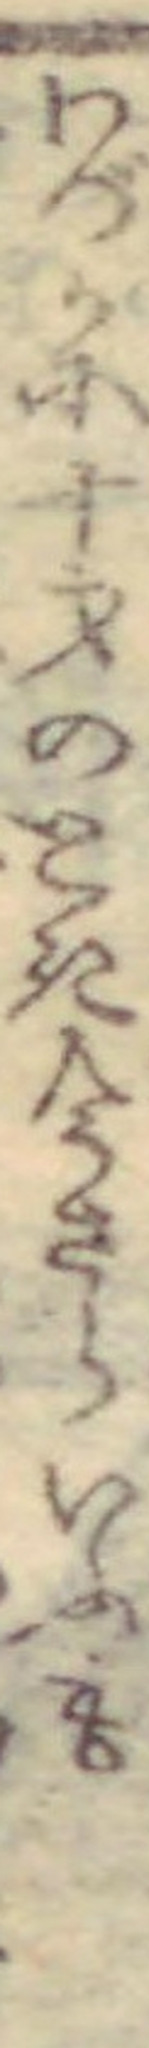わづかに十才のとき今さらいふも
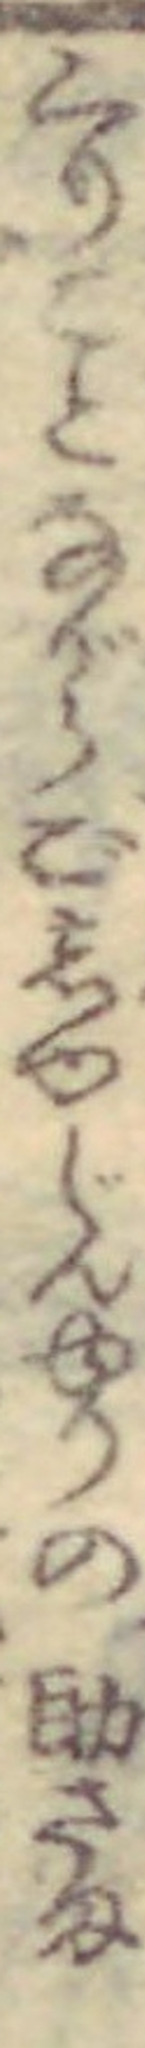くりことながらごしゆじんゆりの助さま
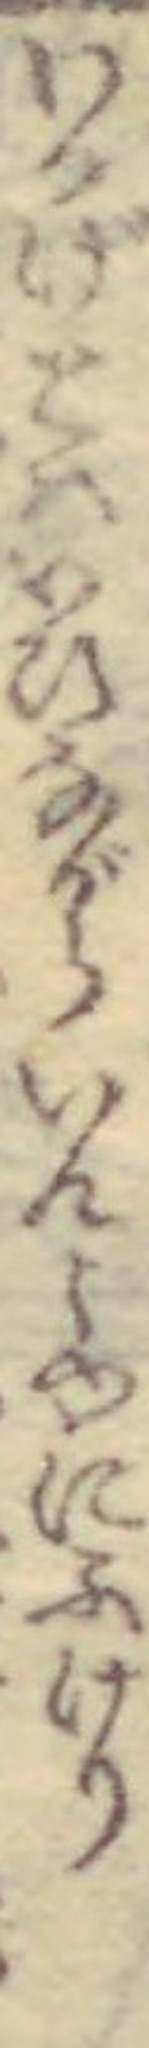わかげとはいひながらいんしゆにふけり
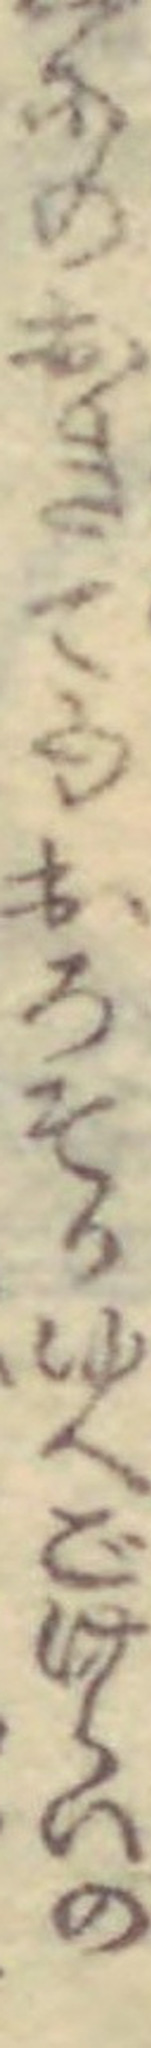くにのおきてもおろそかゆへごけらいの
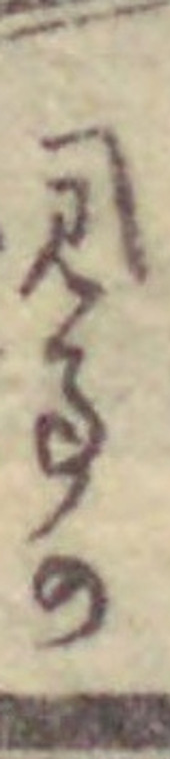〽見事の
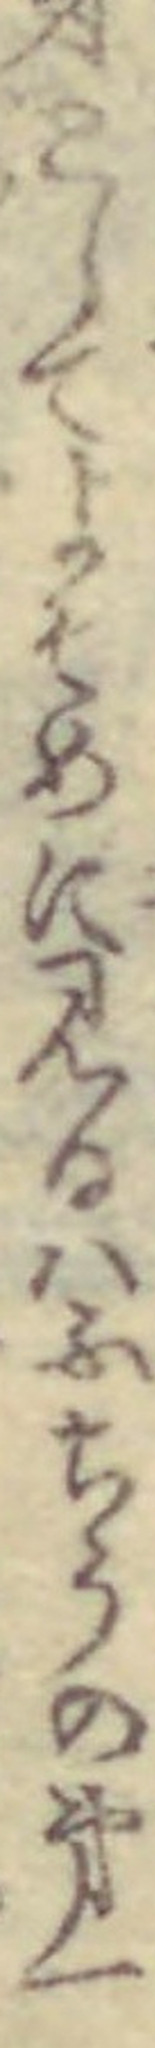身としてよそめに見るはふちうの第一
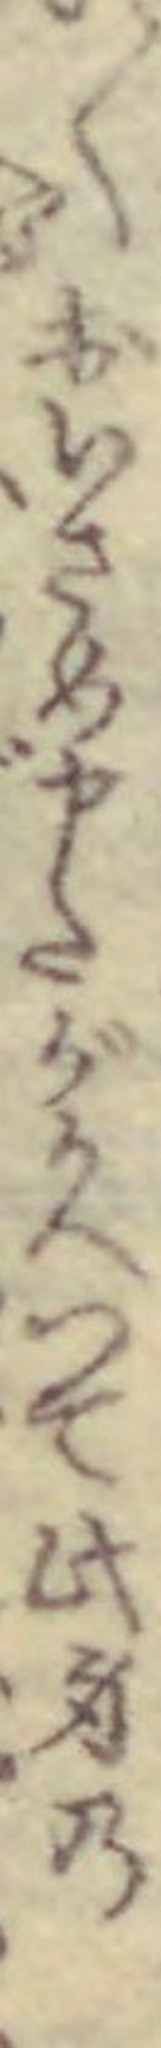たび〳〵おいさめ申たがかへつて此身の
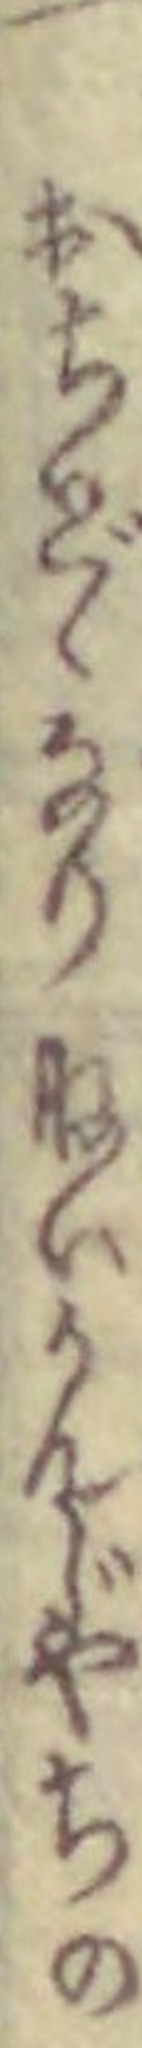おちどゝなりねいかんじやちの
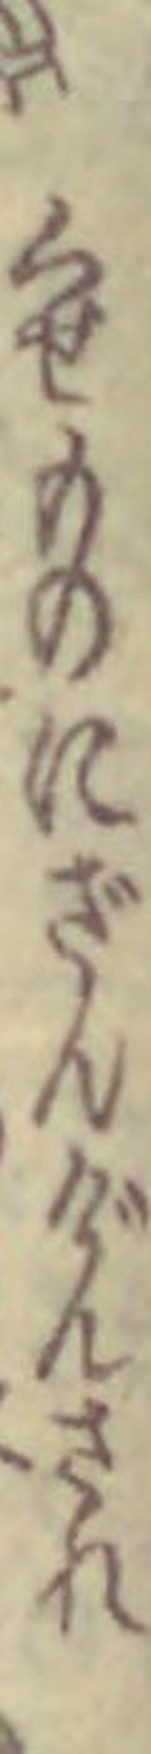くせものにざんげんされ
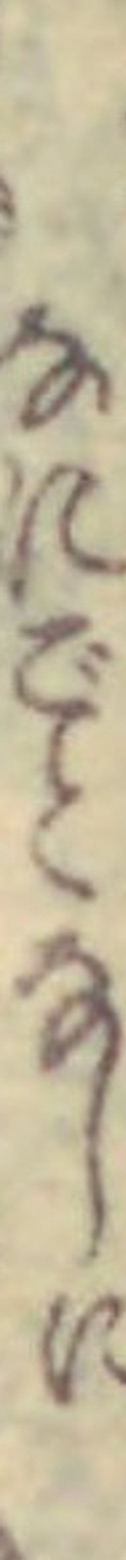なにごとなしに
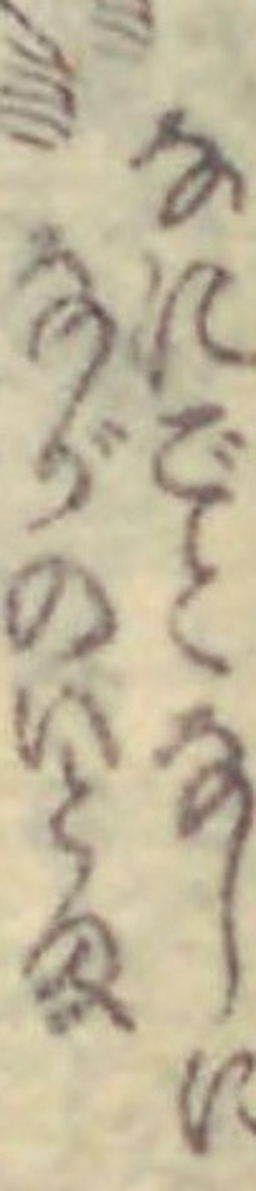ながのいとま
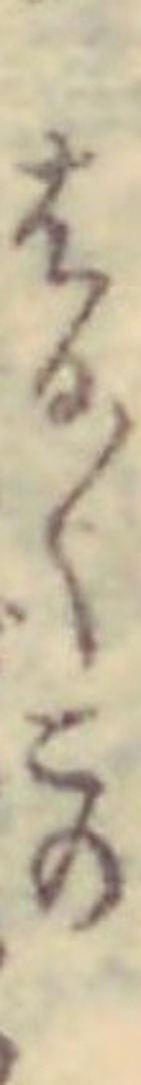はる〳〵この
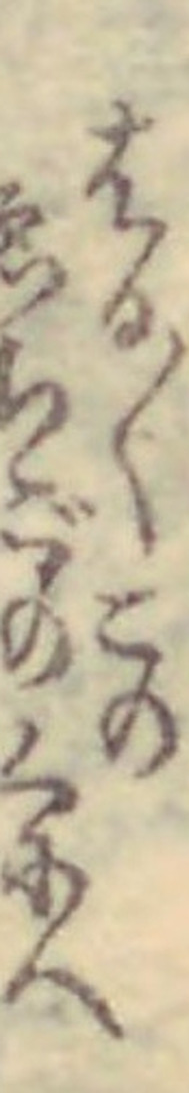ゑちごのくにへ
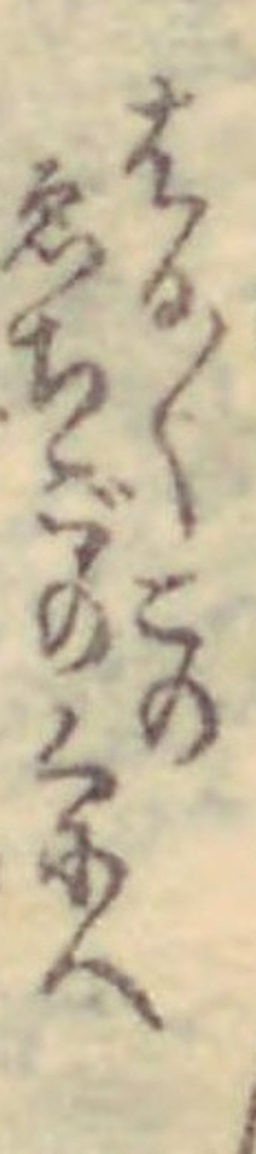ゑちごのくにへ
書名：八ツ目鱣因縁物語 3巻
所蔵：国立国会図書館 National Diet Library, JAPAN
